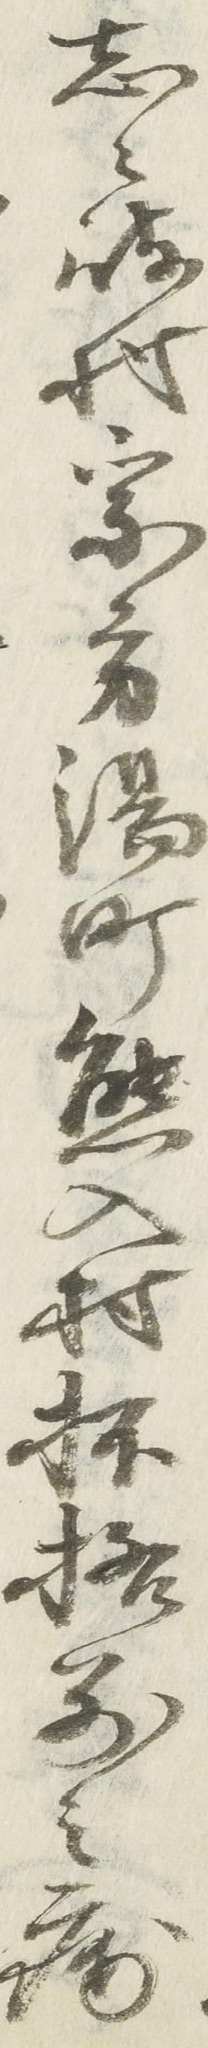しゝ岐村宗方湯町熊入村抔格別之病
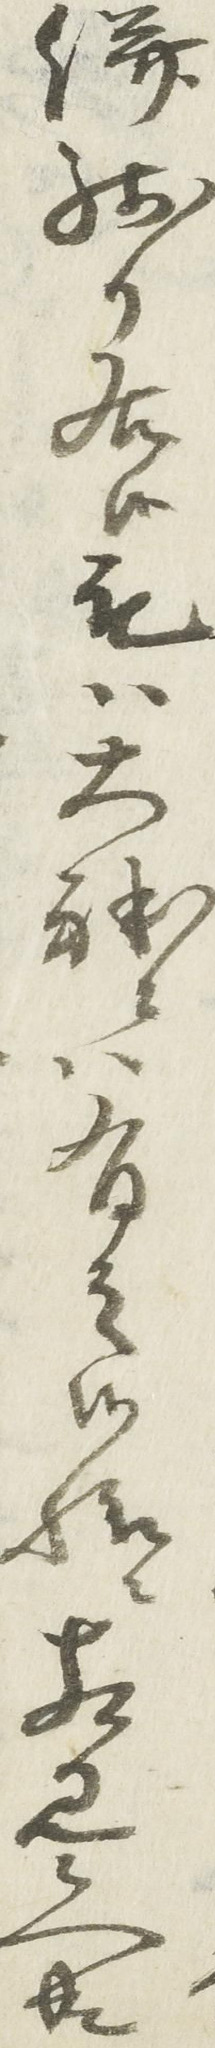併残り居候是は大躰二は有之候様ニ相見候へ共
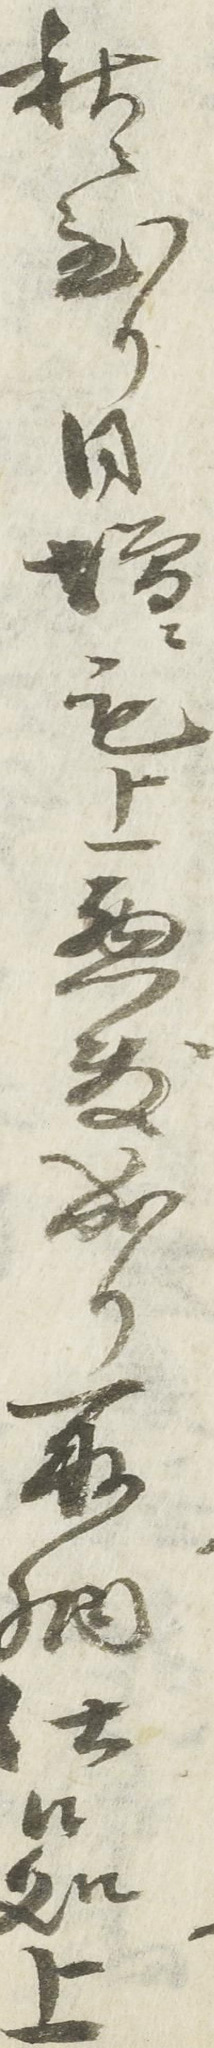秋ニ至り日増ニ是上悪敷成り取調仕候処上
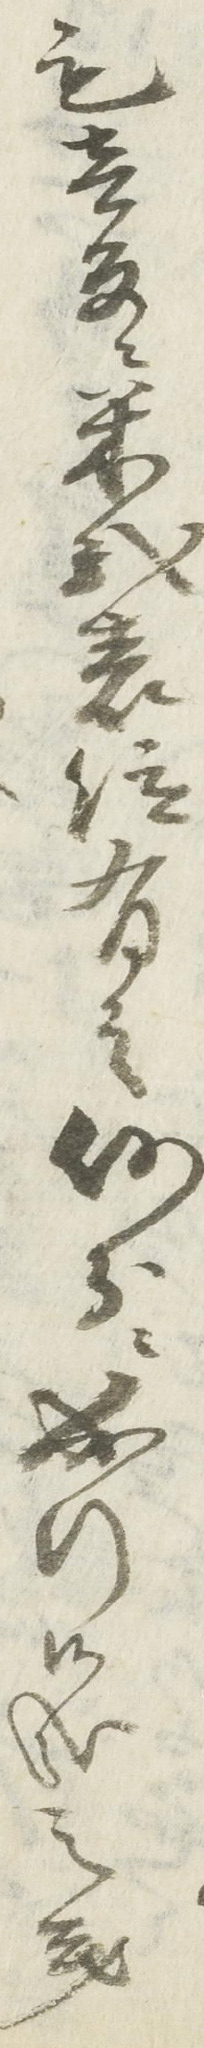毛壱反ニ米弐表位有之何分ニ成行候哉の義
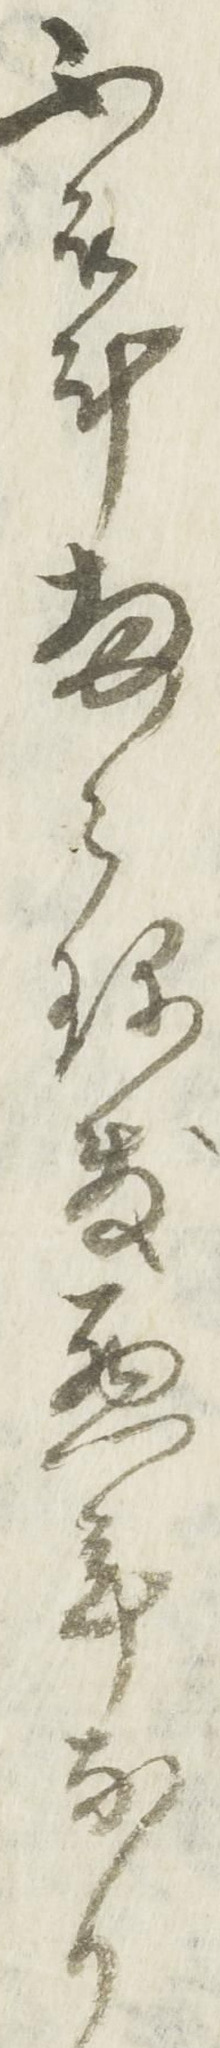不取計扨々珍敷悪年なり
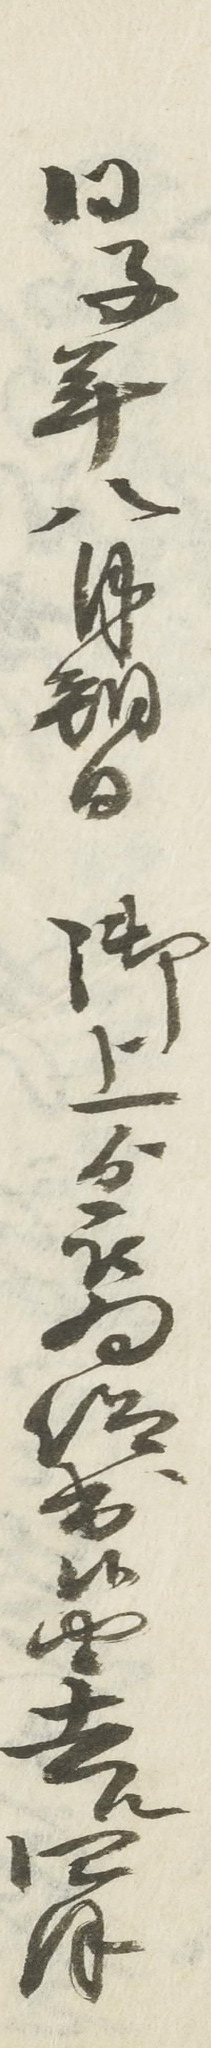一同子年八月朔日御上ゟ被為仰出候由去ル四月
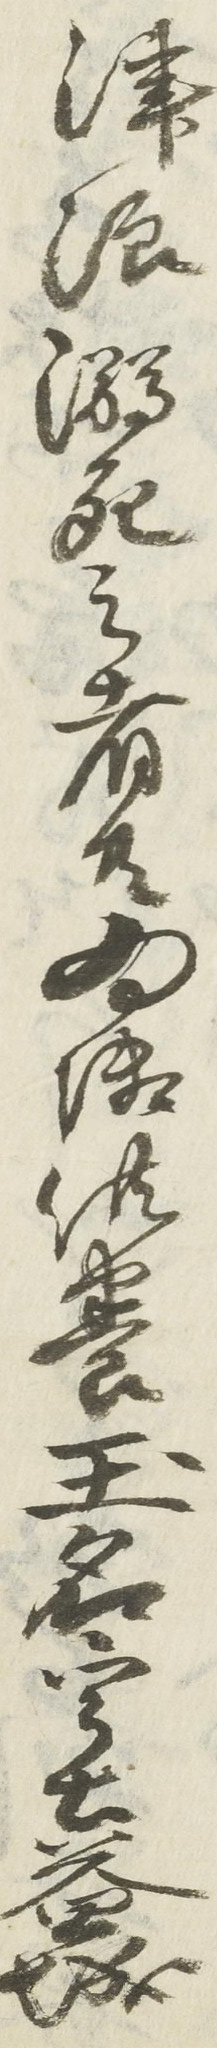津浪溺死之者共為御供養玉名宇土益城
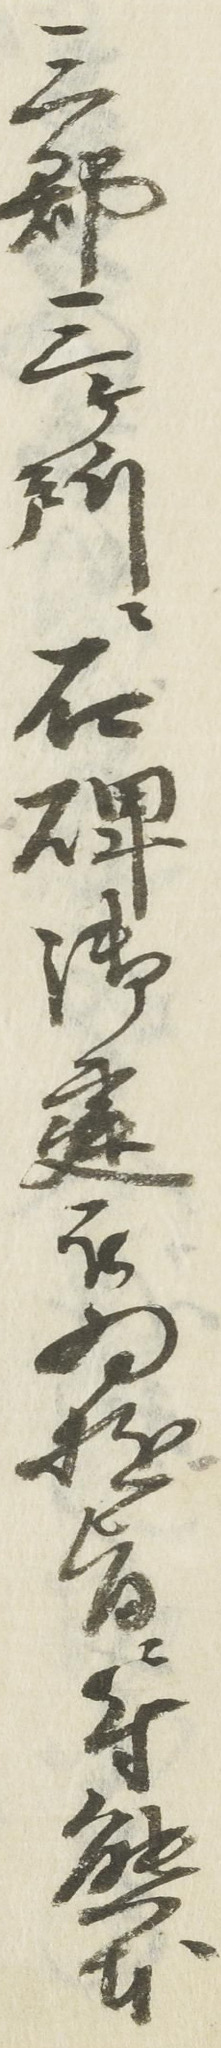三郡三ヶ所ニ石碑御建被為遊旨ニ付熊本
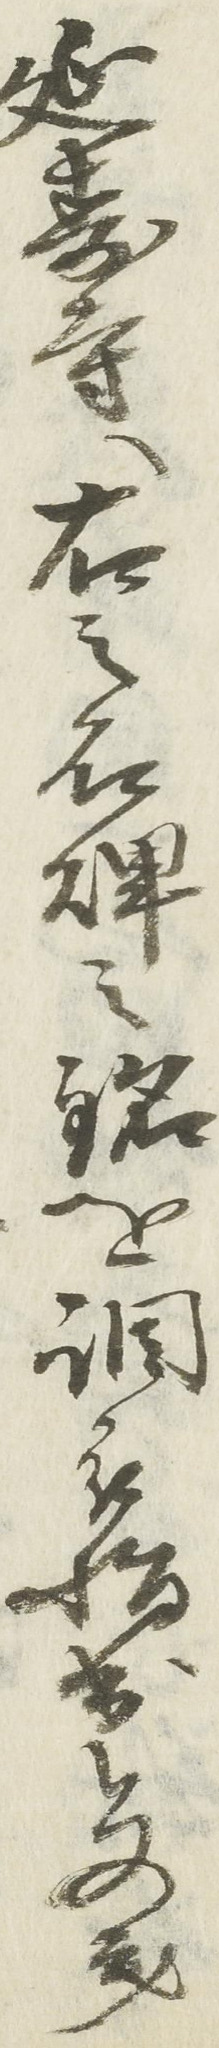延寿寺へ右之石碑之銘を調被差出との義
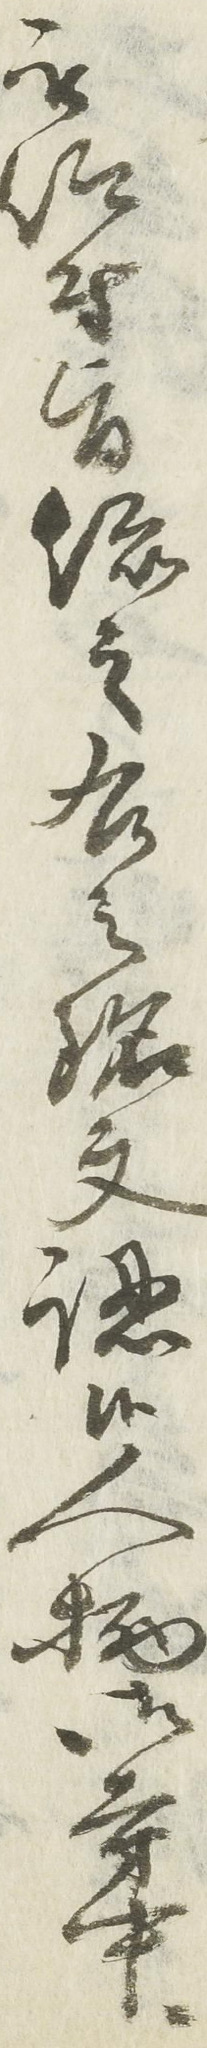被仰付旨依之右之銘文認候人柄御寺中
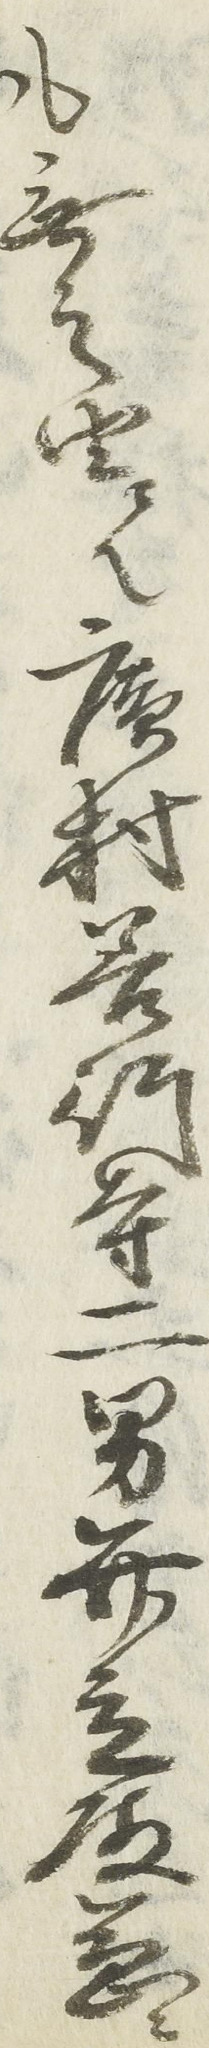も無之由ニて広村善行寺二男弁立殿兼々
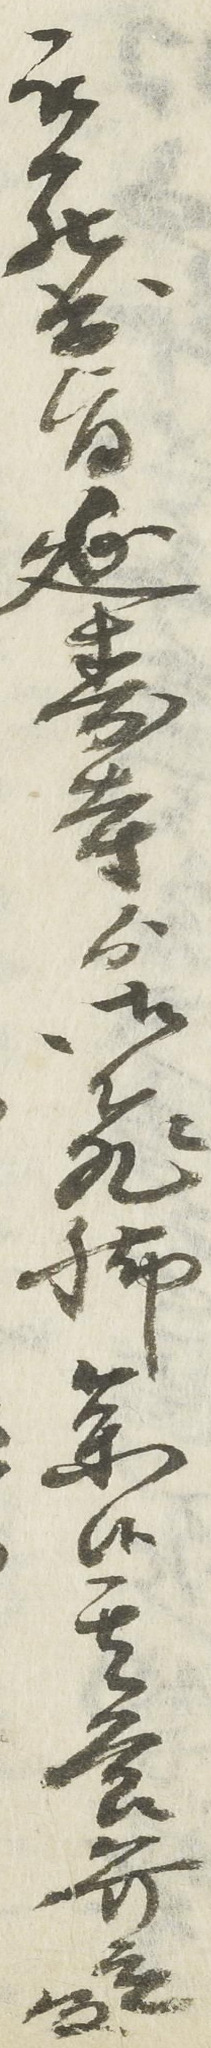被罷出旨延寿寺ゟ御飛脚参候其節弁立殿
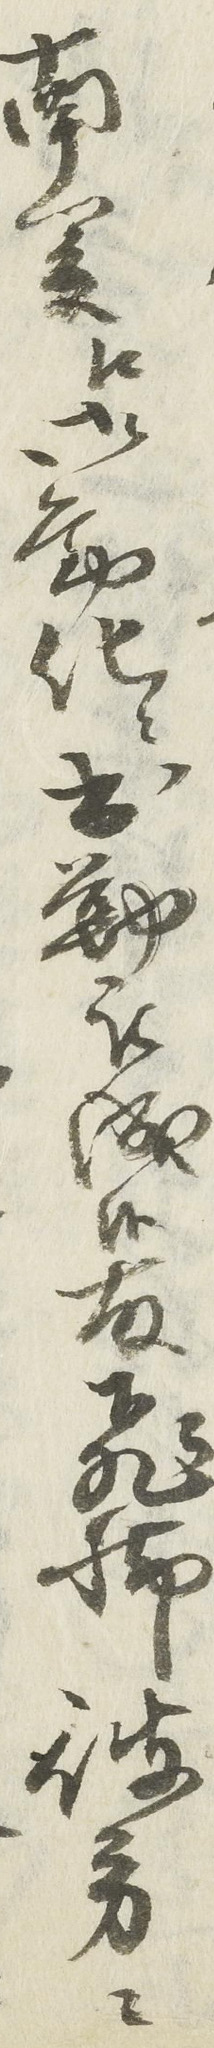南関江御勧化ニ出勤被成候故飛脚彼方ニ
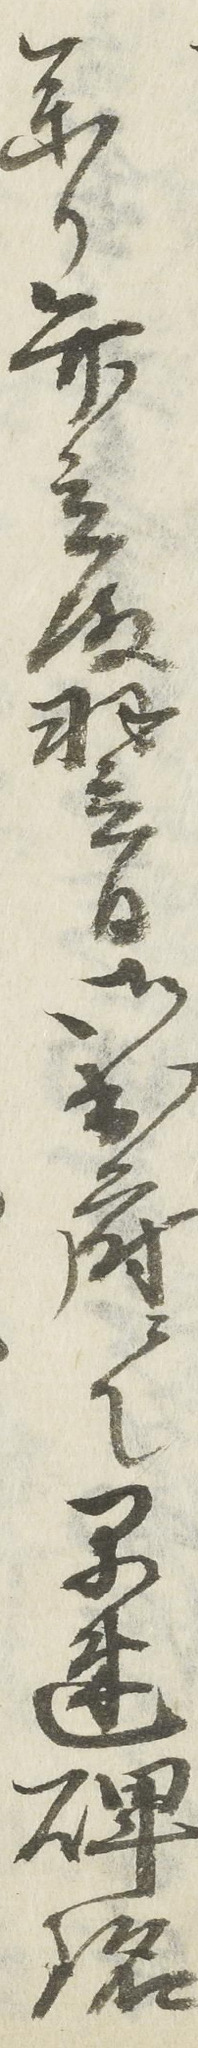参り弁立殿翌日御出府ニて早速碑銘
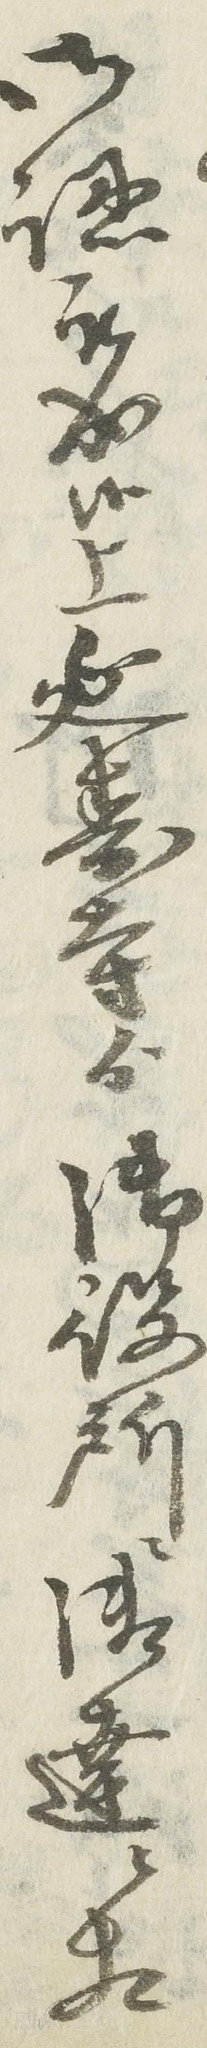御認被成候上延寿寺ゟ御役所ニ御達ニ相
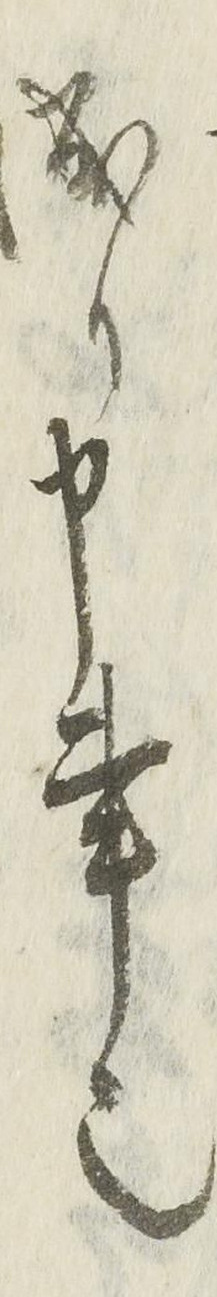成り申事也
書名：後見笑
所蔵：東京大学地震研究所図書室 Earthquake Research Institute Library, The University of Tokyo, JAPAN
